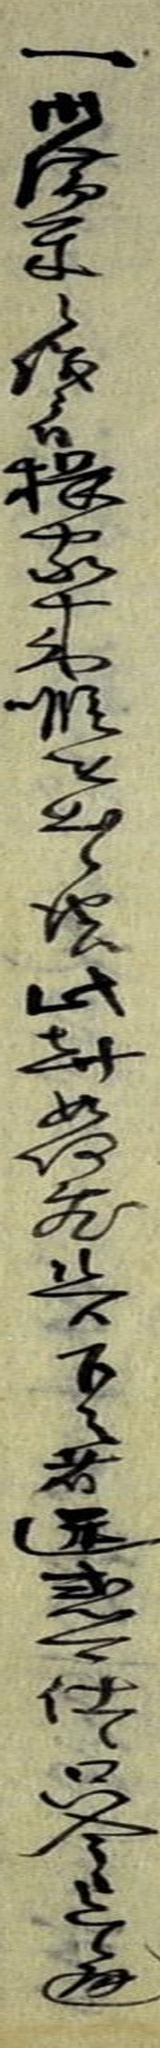一御借米之儀ニ付猥家来暇を出候儀ハ此刻如何敷且ハ下之者迷惑可仕候只今迄之通
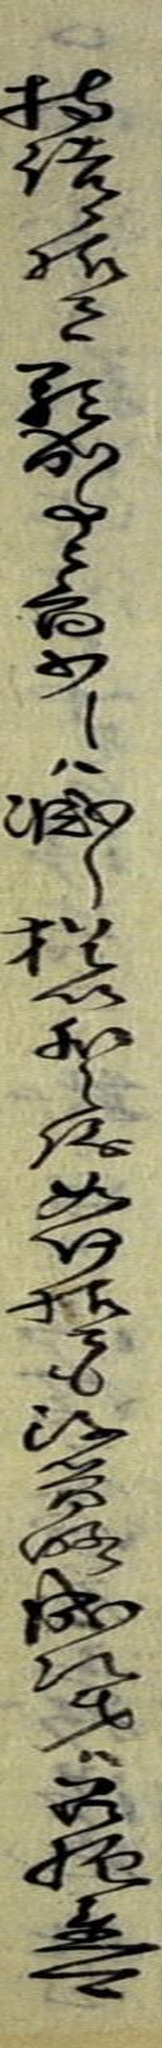持詰候様ニハ難成事ニ候間少しハ減し猶以外之儀如何様ニも致簡略成次第ハ召抱置可
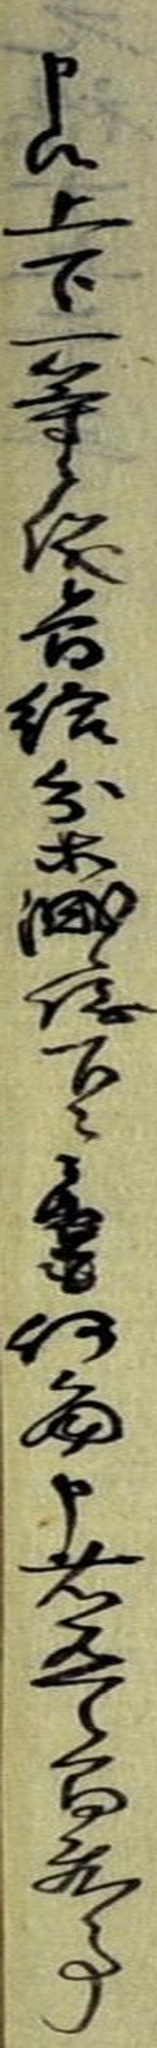申候上下一等之儀候間給分等減候儀下々ニも何角申者有之間敷事
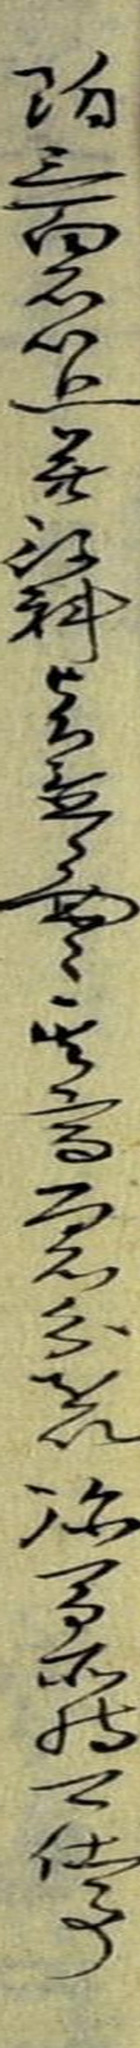附三百石以上并役料被下置候面々其高百石分を以弥馬所持可仕事
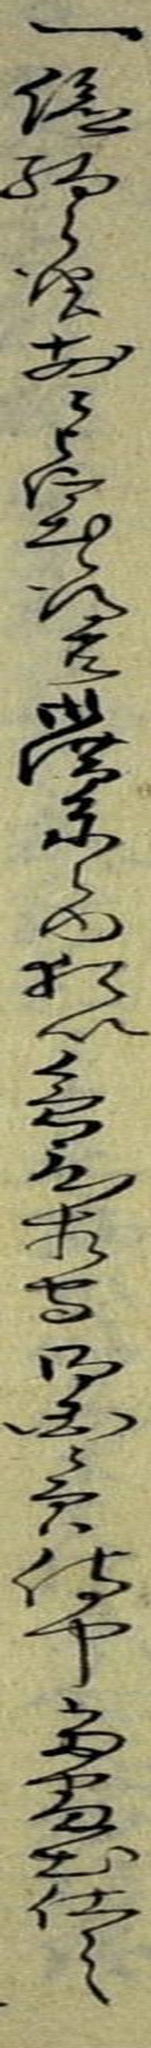一倹約之儀ハ前々被仰出候得共御借米之内猶以急度相守御国ニ而ハ侍中当番出仕之
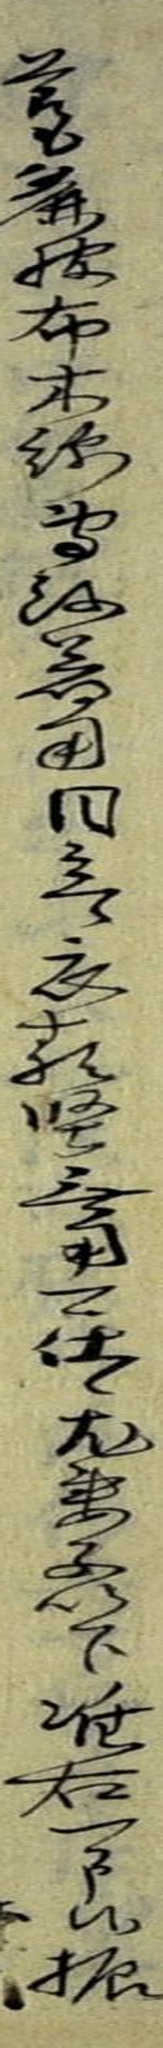節も麁服布木綿専致着用目立候衣類堅無用可仕候尤妻子以下准右可申候振
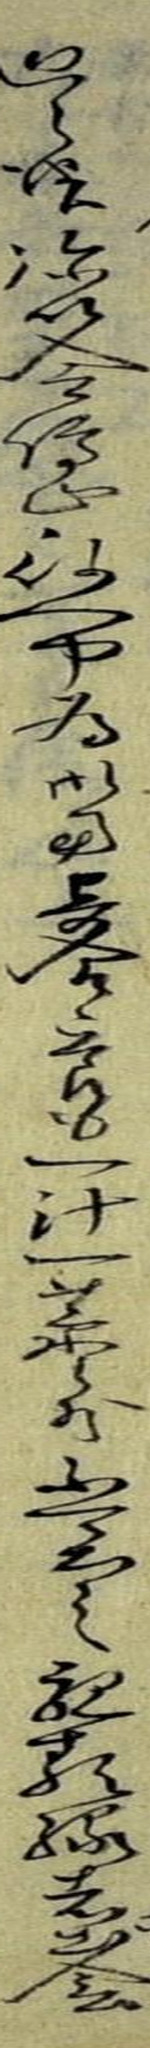廻之儀ハ弥以令停止役人中為御用寄合候節も一汁一菜之外不可出之親類縁者等出会
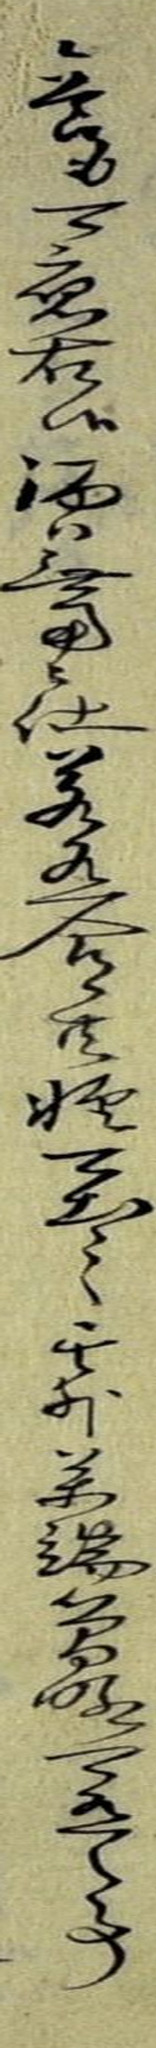候節も可応右候酒ハ無用ニ仕若有合候共軽可出之其外万端簡略可有之事
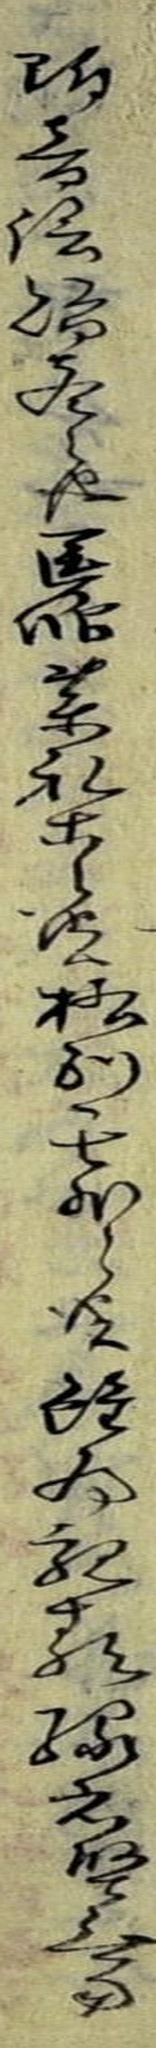附音信贈答之儀医師薬礼等之儀ハ格別其外之儀ハ雖為親類縁者堅無用
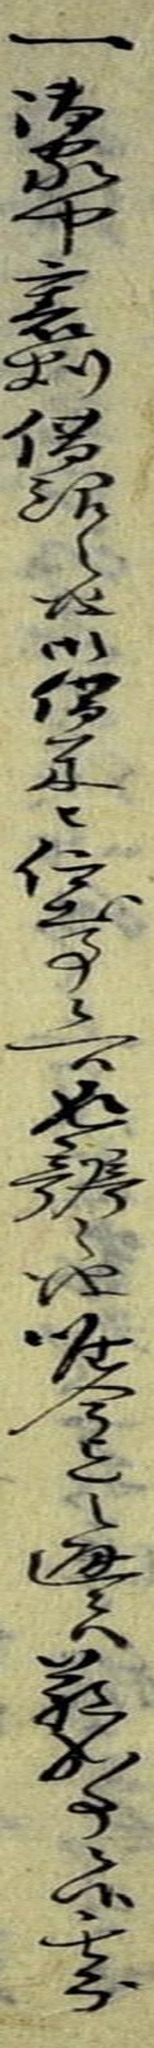一御家中裏判借銀之儀御借米被仰出事候ヘハ返弁之儀唯今迄之通ニハ難成事ニ候其分
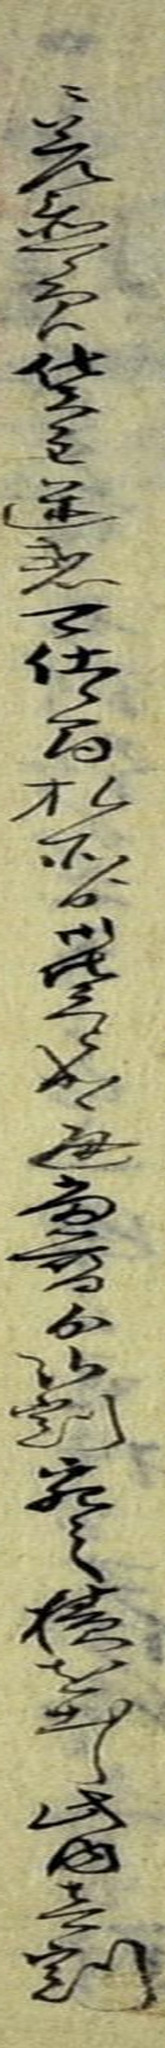ニ差置候而ハ貸主迷惑可仕候間札所ゟ御貸被成候通当暮ゟ弐割宛之損を出し此内壱割
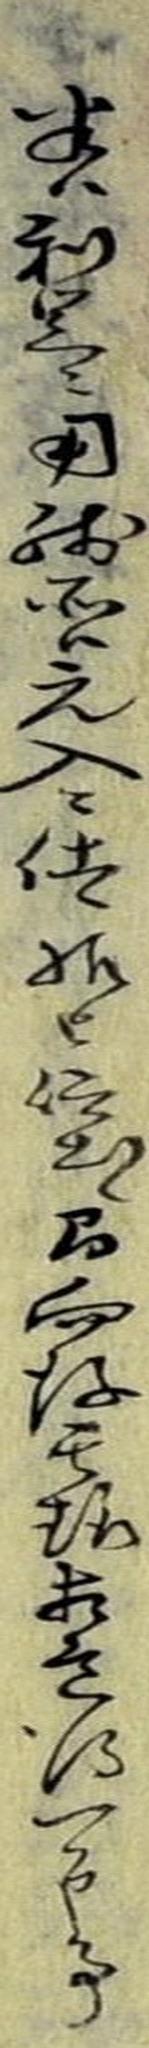半ハ利足ニ用残所ハ元入ニ仕候様被仰出候間向後其趣相意得可申事
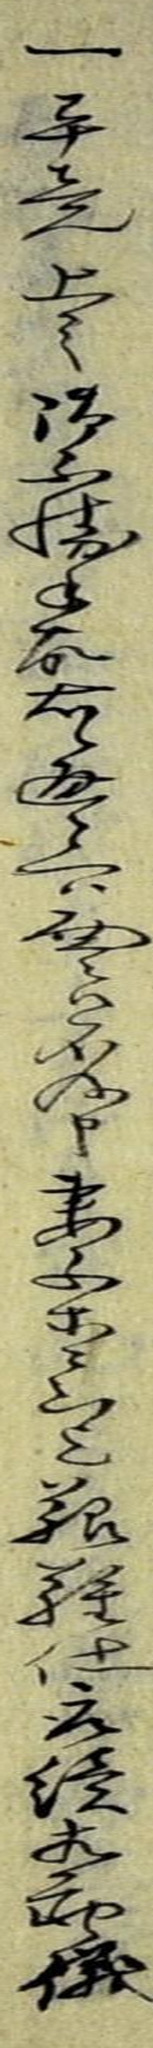一畢竟上之御不勝手故右之通候ヘハ面々ハ不及申妻子等ニ至迄艱難仕取続相勤候儀
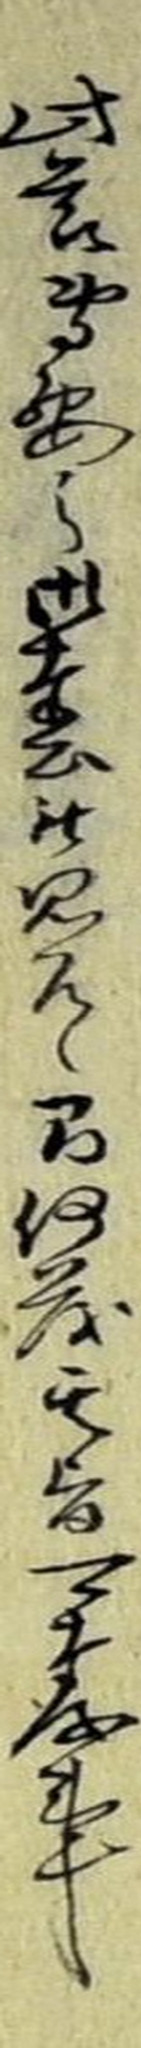此節専要之御奉公被思召候間何茂其旨可奉存事
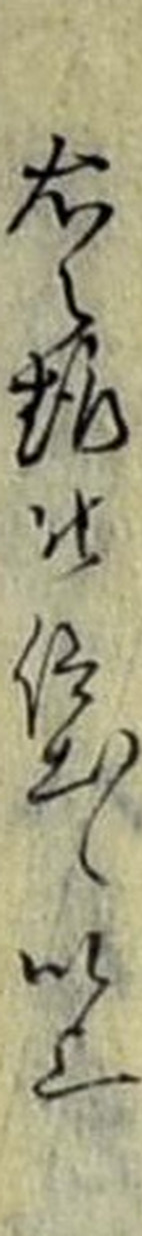右之趣被仰出候以上
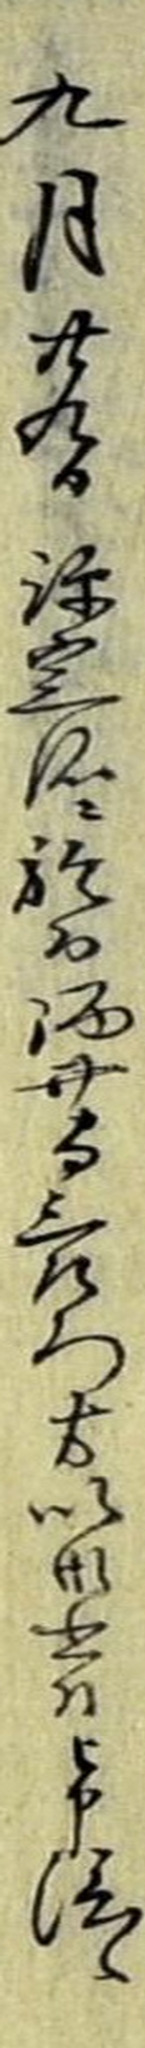九月廿九日評定所ニ於而酒井与三左衛門方以御書付被申渡候
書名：命令之部 一
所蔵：福井県文書館 Fukui Prefectural Archives
